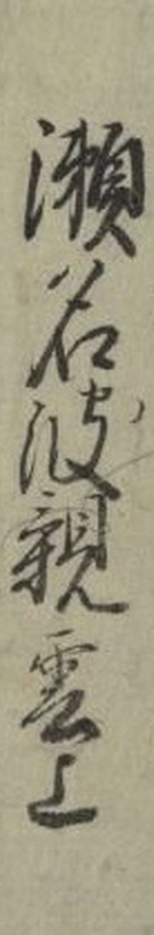瀬名波親雲上
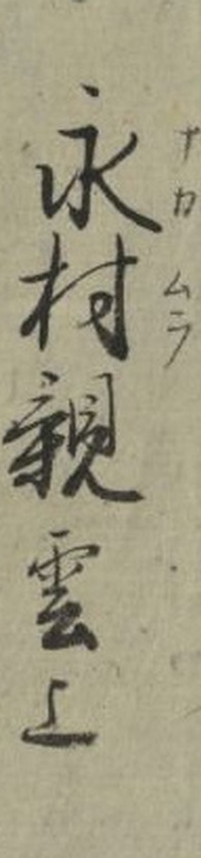永村親雲上
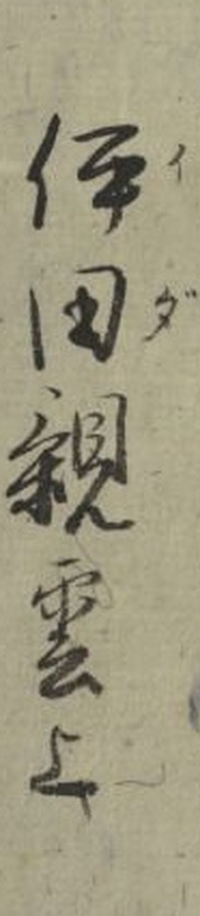伊田親雲上
